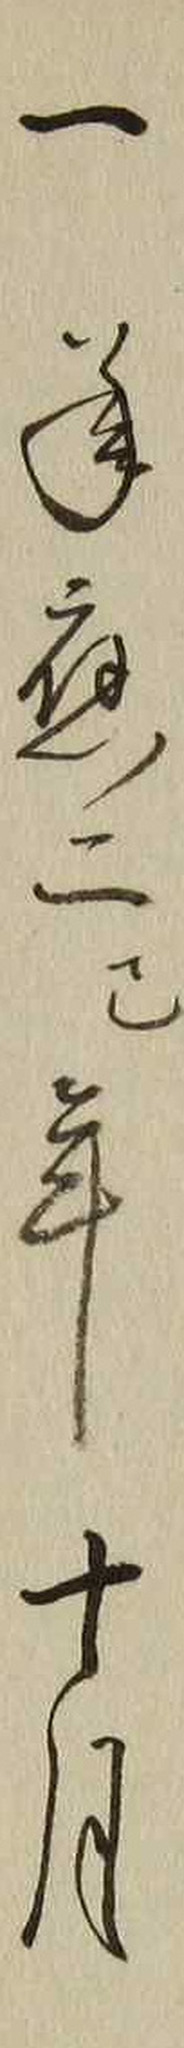一承応二巳年十月
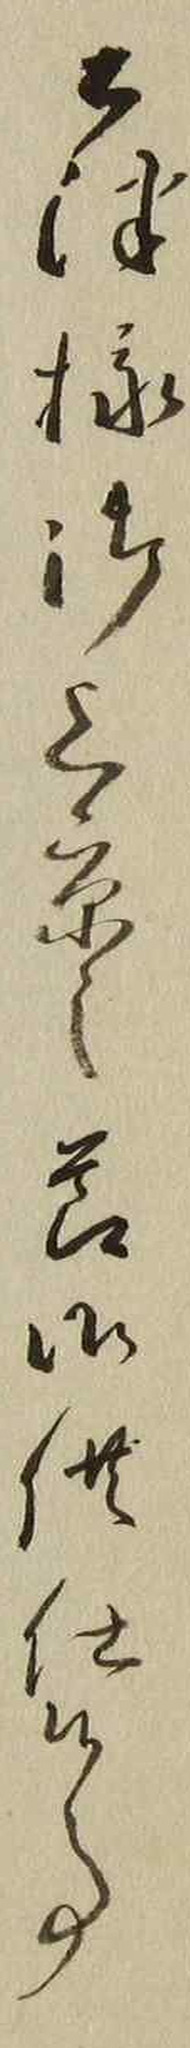土津様御上京の節御供仕候事
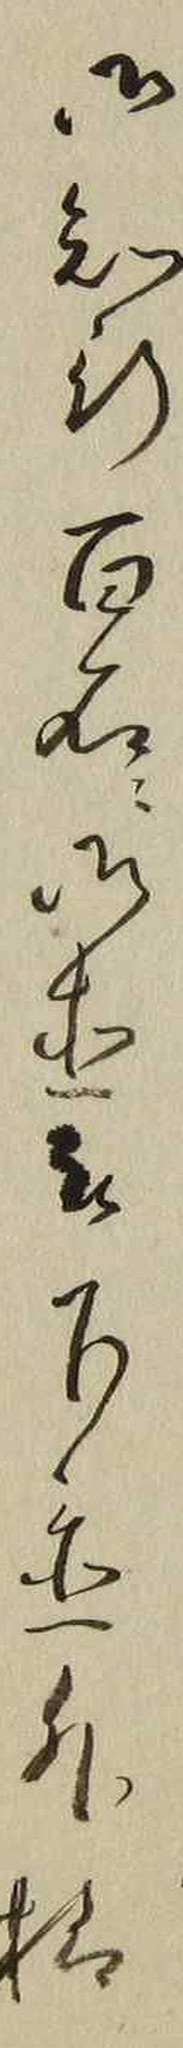御知行百石に御直被下置外様
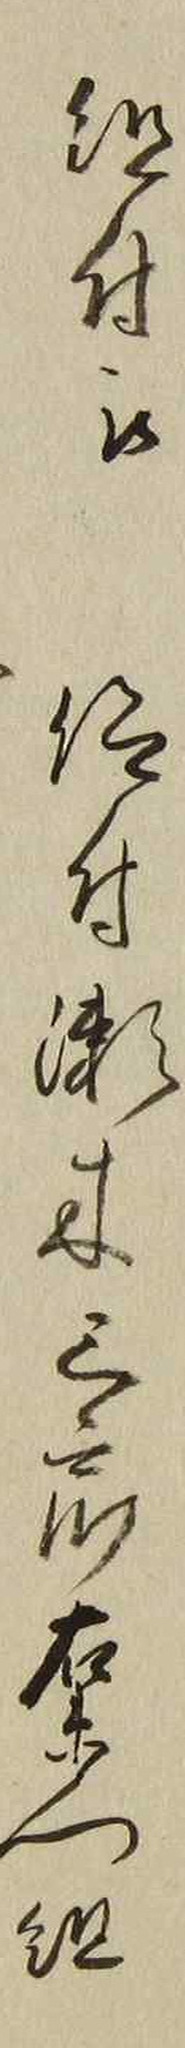組付被仰付瀬木三郎右衛門組
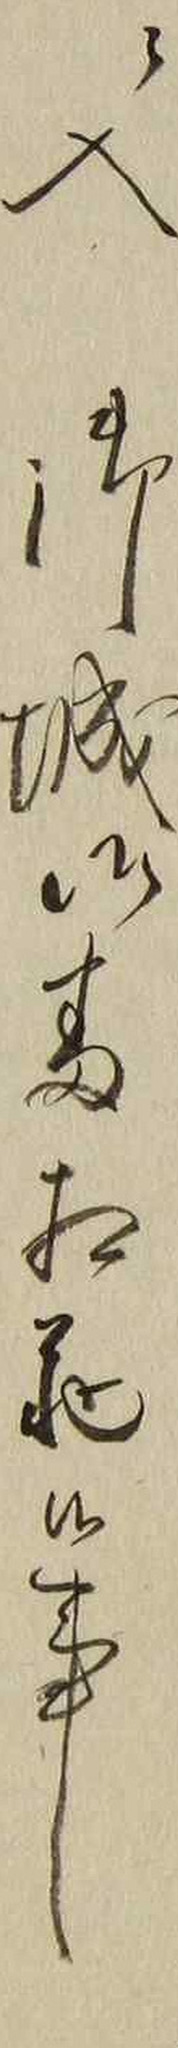に入御城御番相勤候事
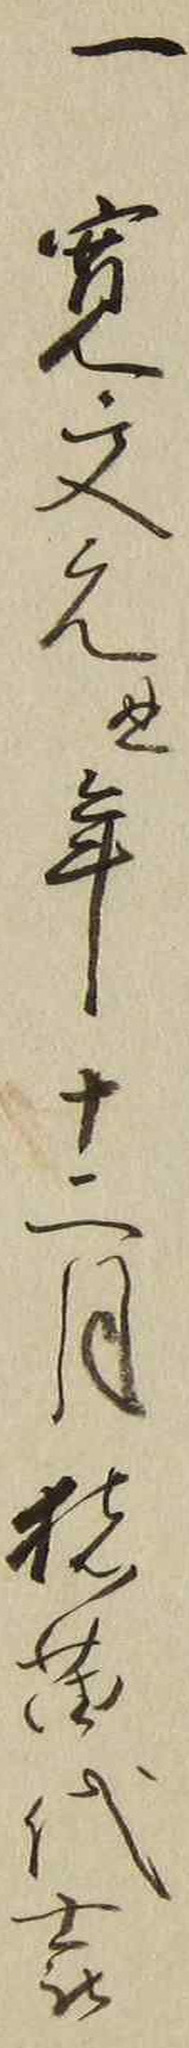一寛文元丑年十二月猪苗代士被

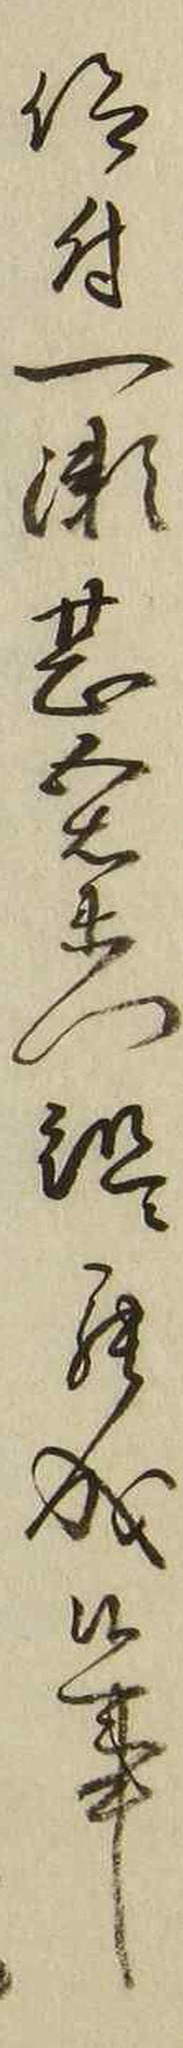仰付一瀬甚五右衛門組に罷成候事
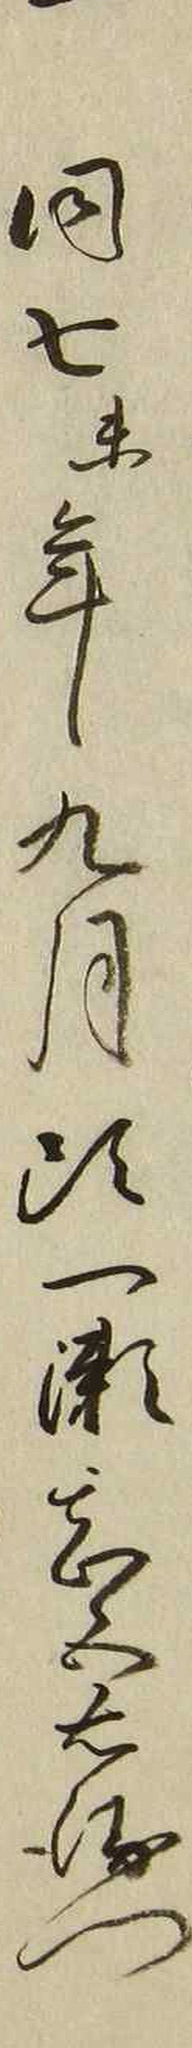一同七未年九月頭一瀬甚五右衛門
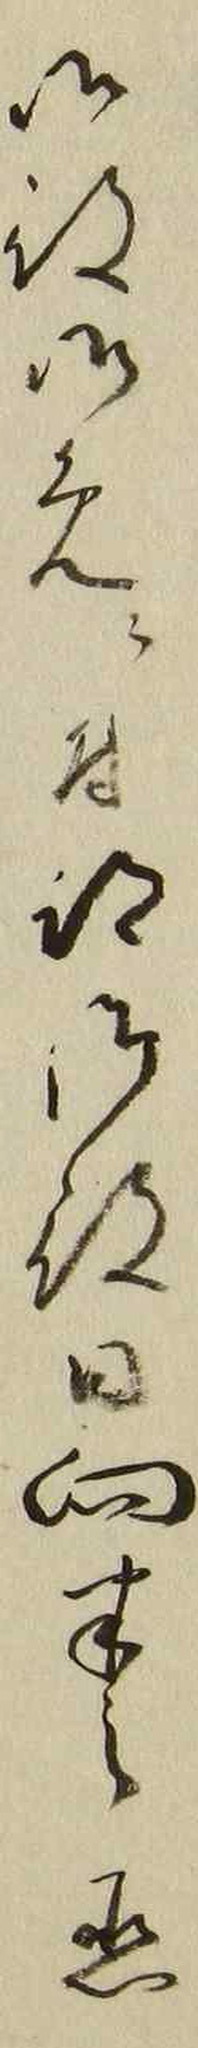御役御免に付跡御役日向半之丞
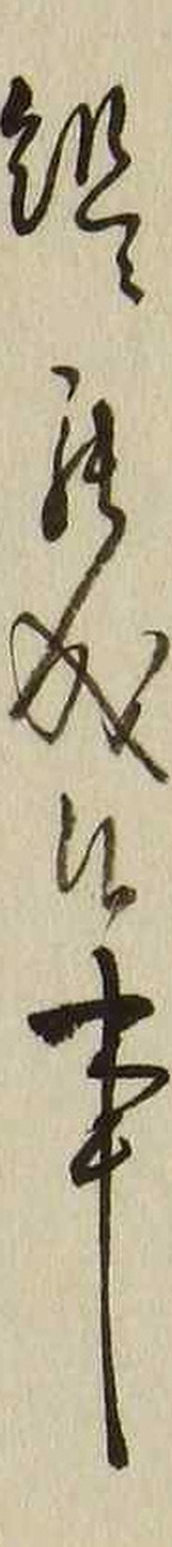組に罷成候事
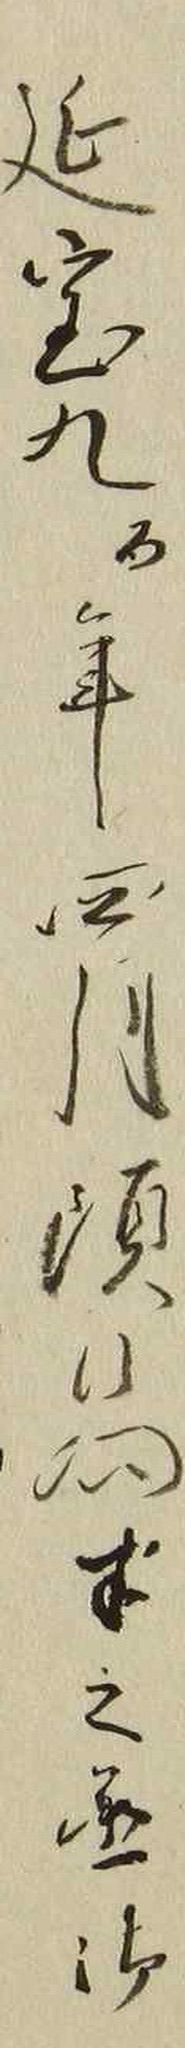一延宝九酉年四月頭日向半之丞御
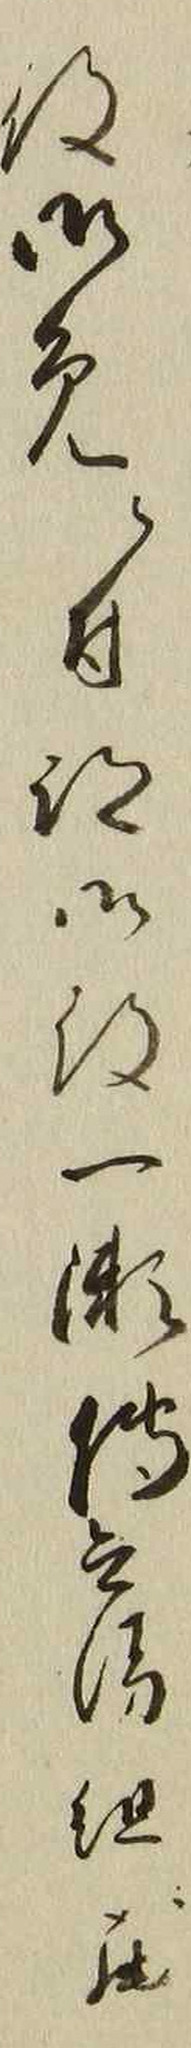役御免に付跡御役一瀬伝兵衛組に罷
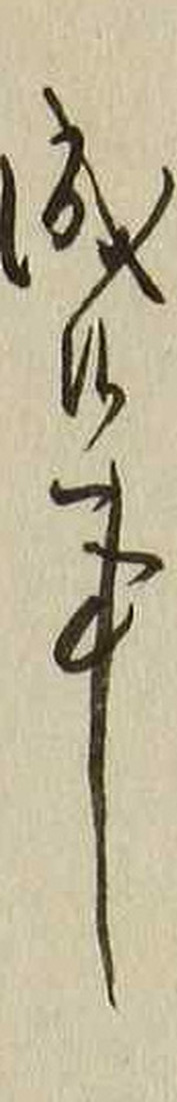成候事
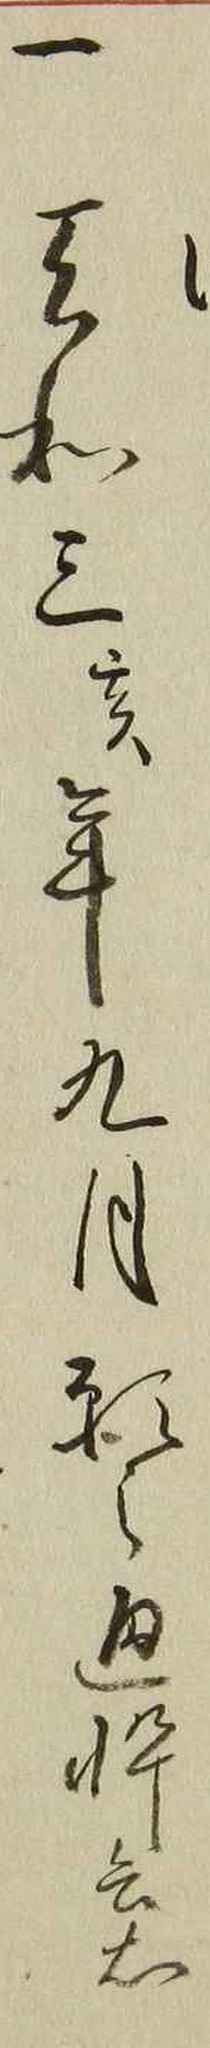一天和三亥年九月願の通忰兵右
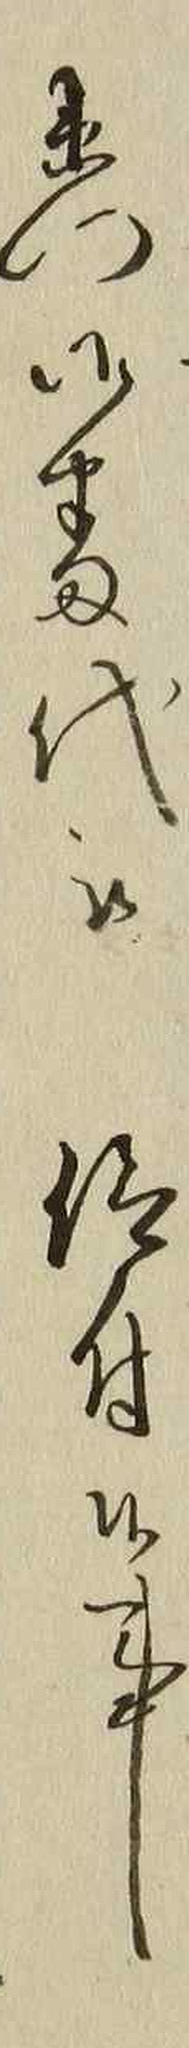衛門御番代被仰付候事
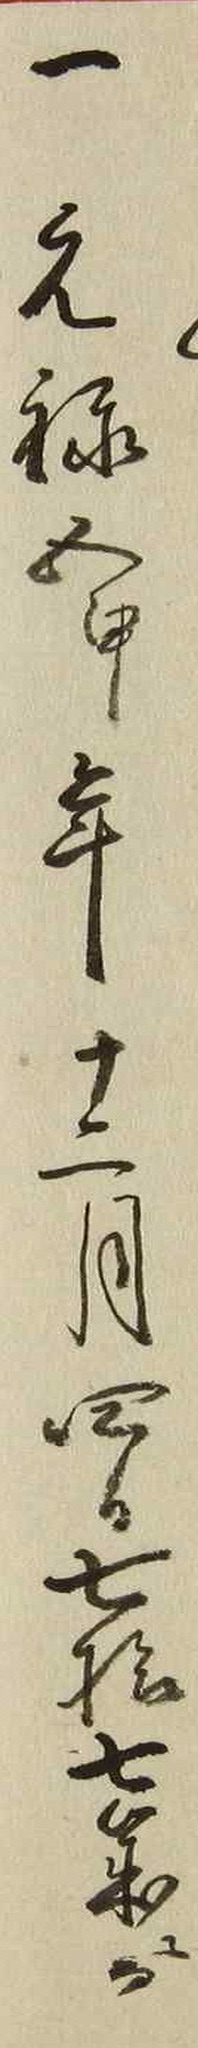一元禄五申年十二月四日七拾七歳に而
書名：諸士系譜　巻之1　い之部1
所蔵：会津若松市立会津図書館
